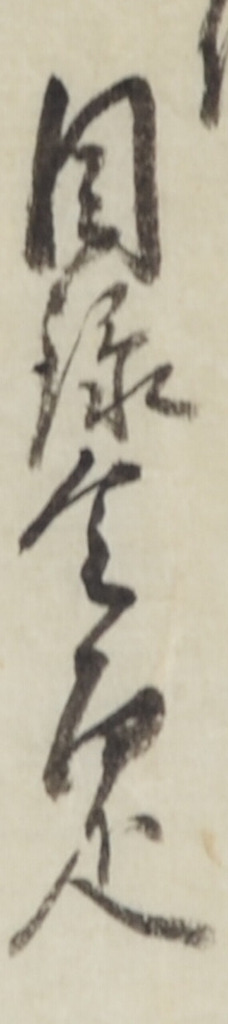目録金百疋
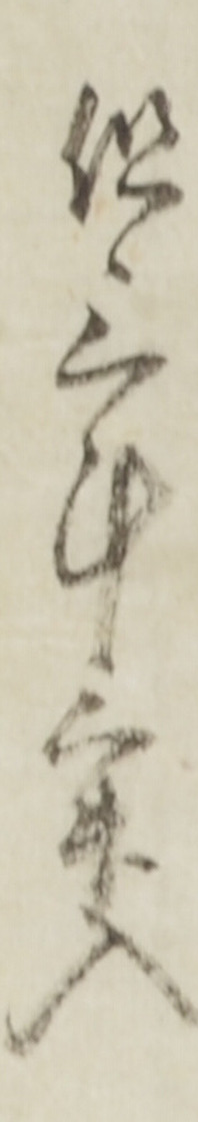但三斗三升入
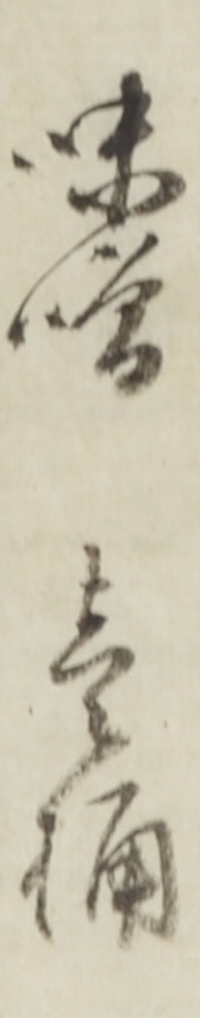味噌壱桶
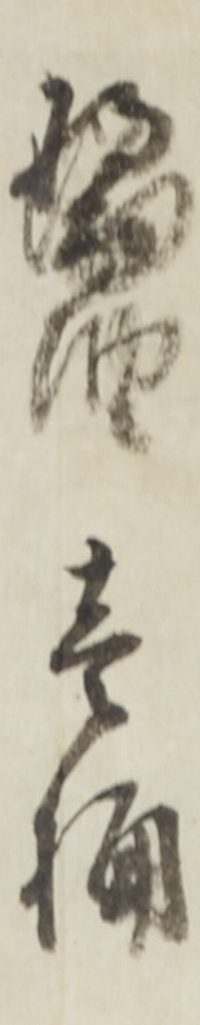醤油壱桶
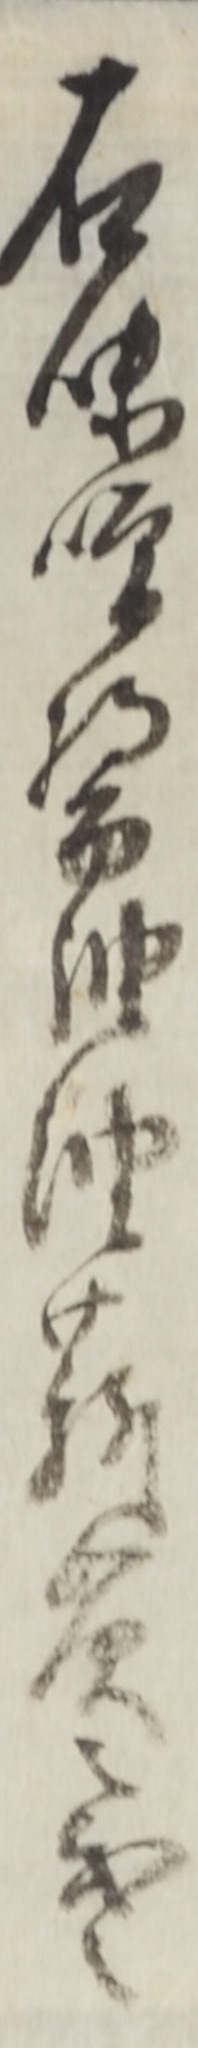右味噌醤油油薪炭之義之
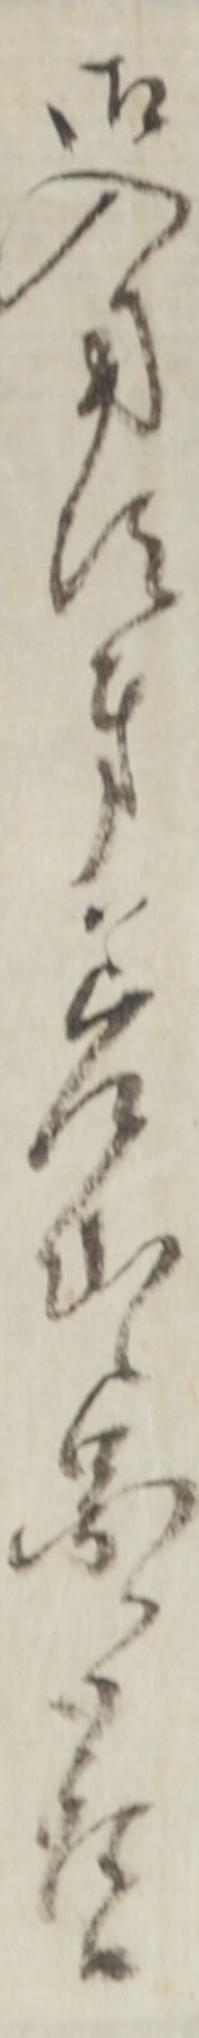御入用次第差出候図り御座候
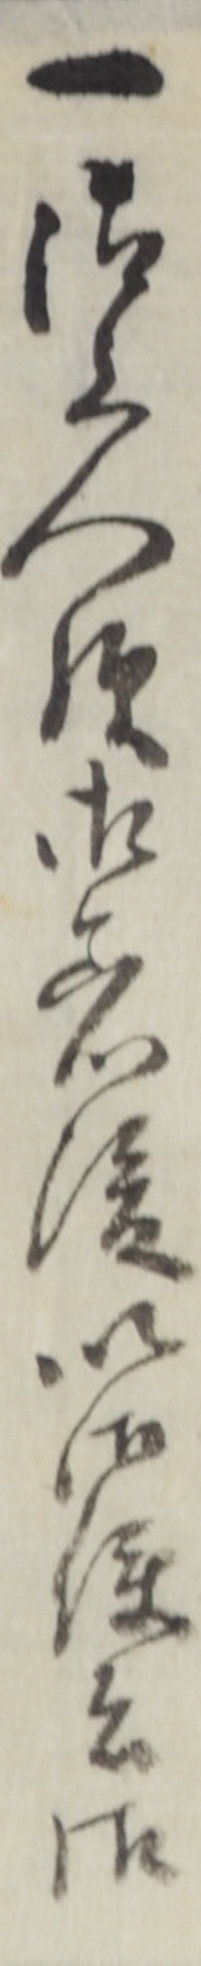一御上人様御着後以御使者御
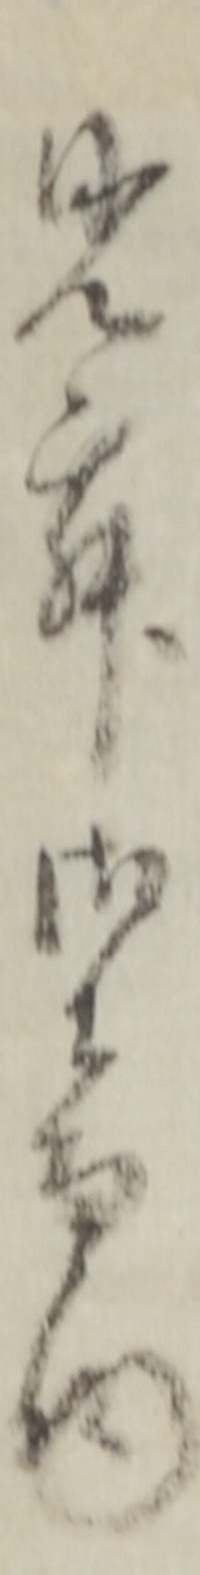見舞御音物

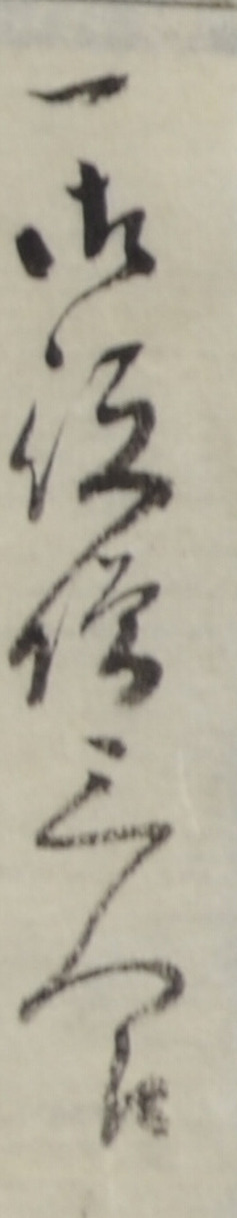一御役僧三人江
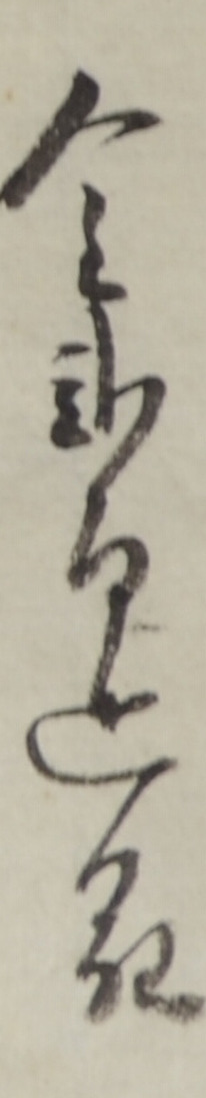金弐百疋宛
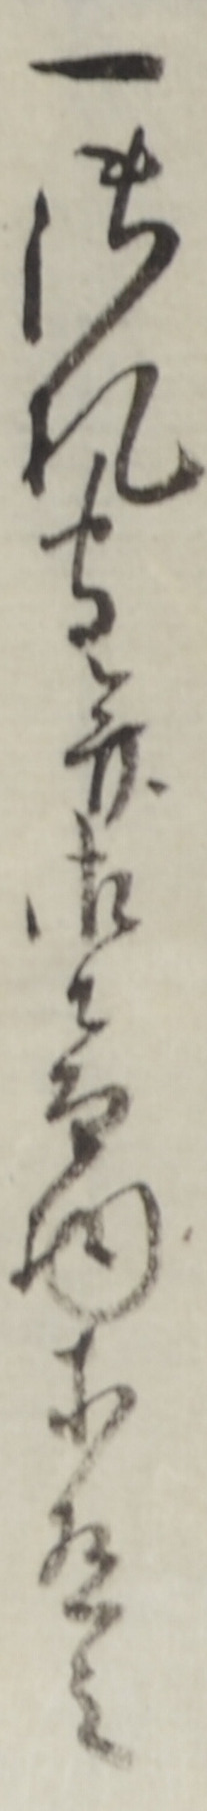一御札守并御音物等有之
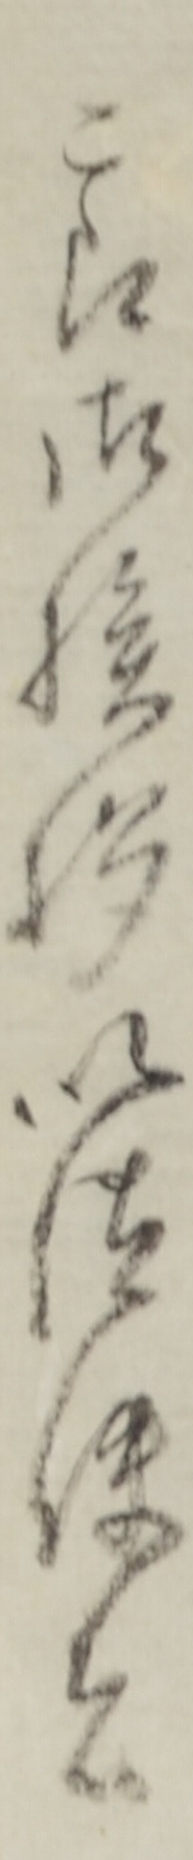節御挨拶以御使者
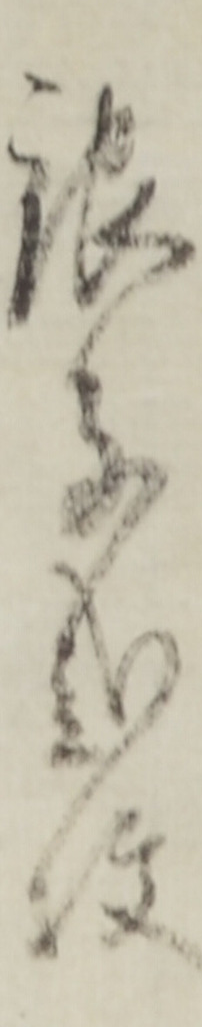銀子弐枚
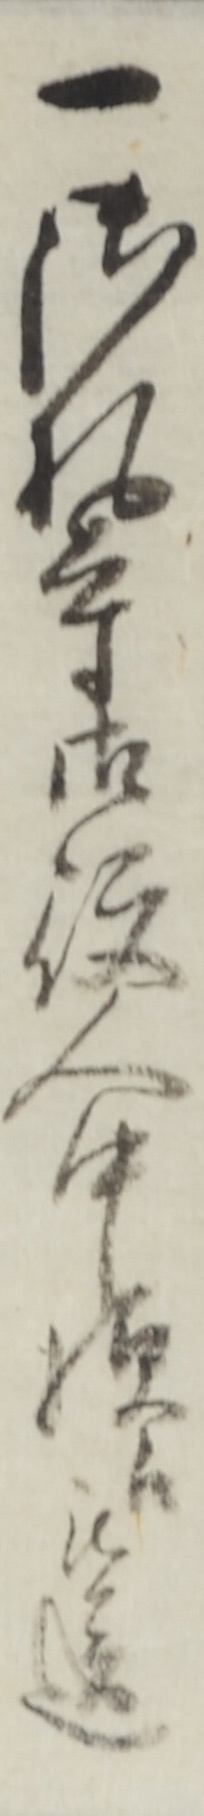一御札寺御役人中頃江被送
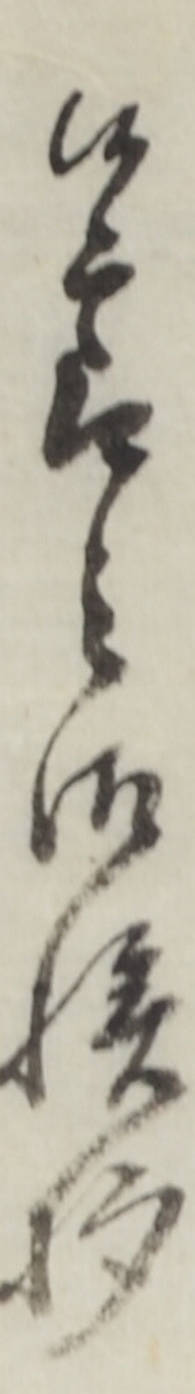候節之御挨拶
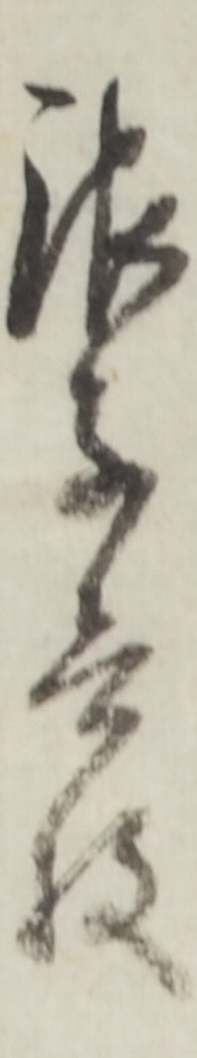銀子壱枚
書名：（覚書）
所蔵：伊那市立高遠町図書館・合同会社AMANE
